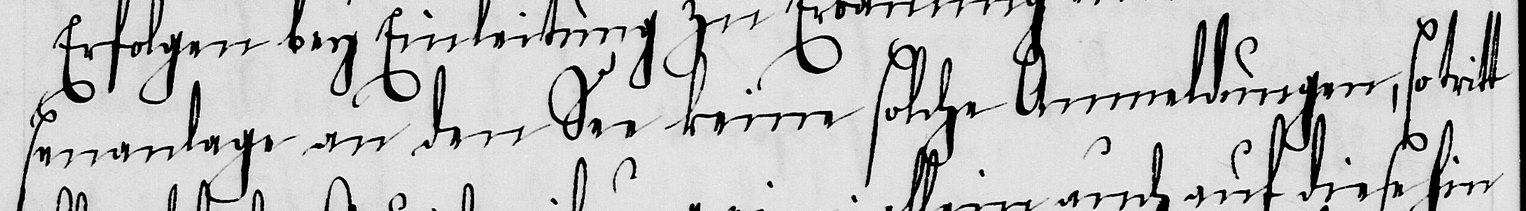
ßenanlage an den See keine solche Anmeldungen, so t¬
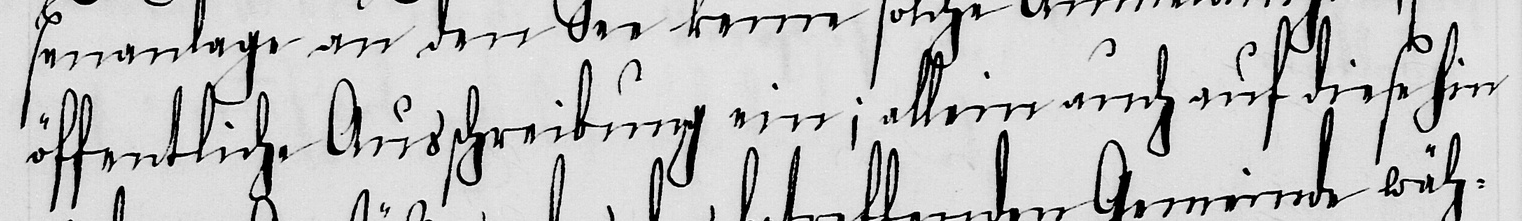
öffentliche Ausschreibung ein; allein auch auf diese hin
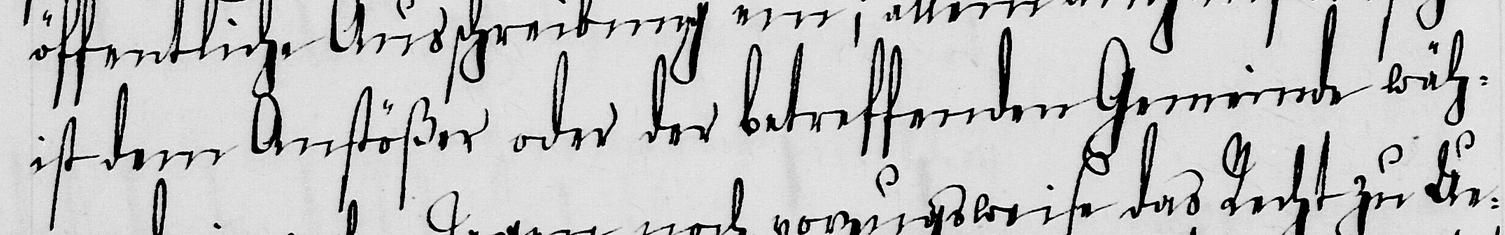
ist dem Anstößer oder der betreffenden Gemeinde wäh¬
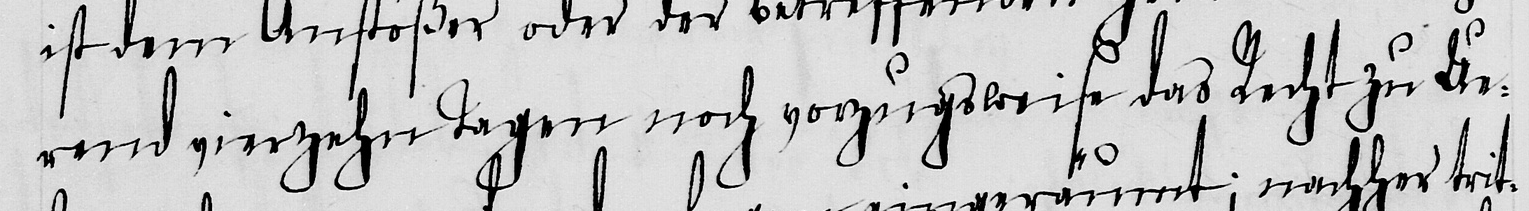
rend vierzehn Tagen noch vorzugsweise das Recht zu Ue¬
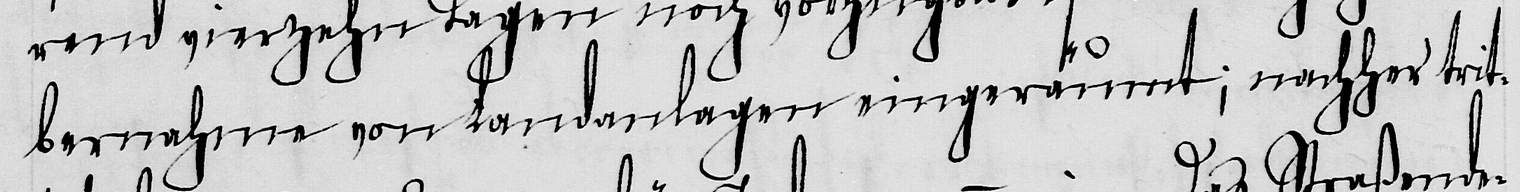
bernahme von Landanlagen eingeräumt; nachher trit¬
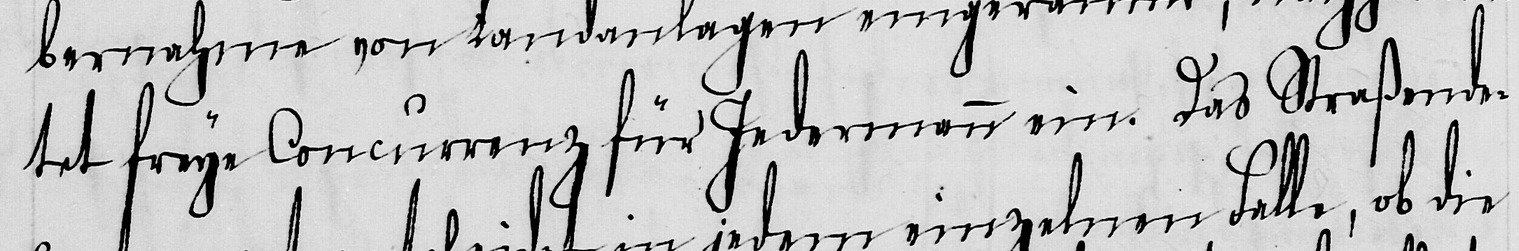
tet freye Concurrenz für Jedermann ein. Das Straßende¬
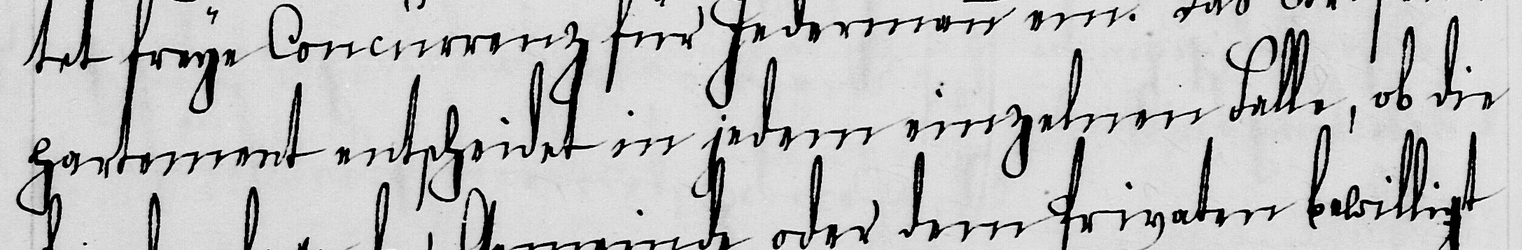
partement entscheidet in jedem einzelnen Falle, ob die
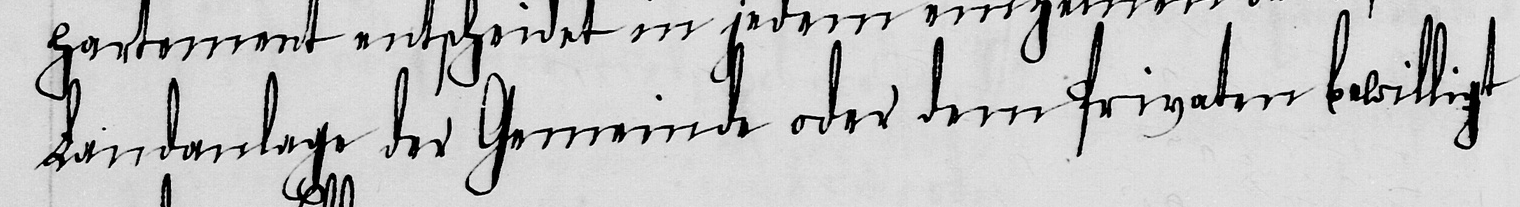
Landanlage der Gemeinde oder dem Privaten bewilli¬
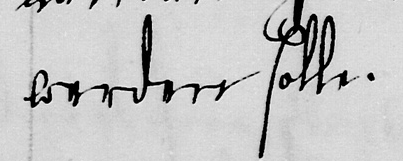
werden soll¬
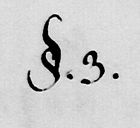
§. 3.
